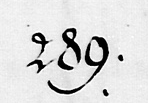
2593.
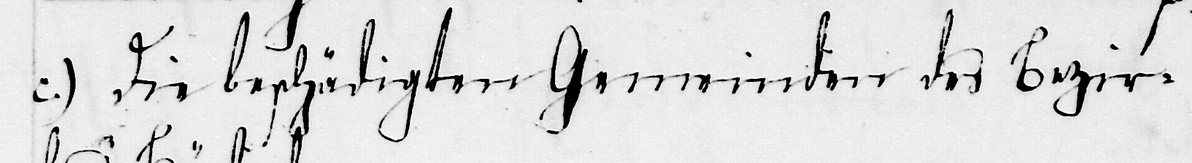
c.) Die beschädigten Gemeinden des Bezir¬
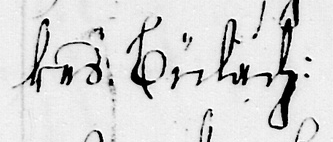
kes Bülach:
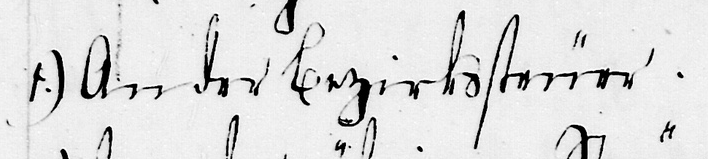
1.) An der Bezirkssteuer
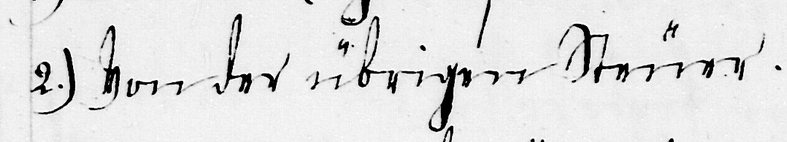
2.) Von der übrigen Steuer
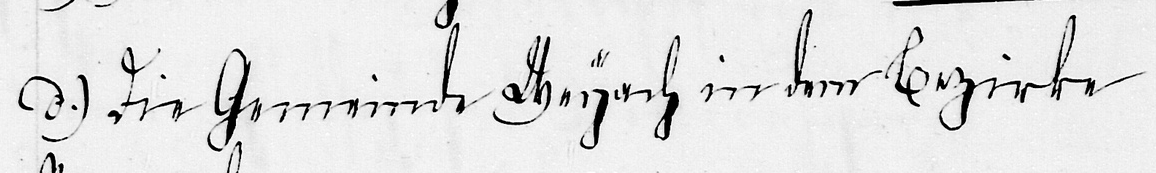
d.) Die Gemeinde Weyach in dem Bezirke
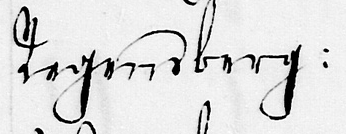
Regensberg:
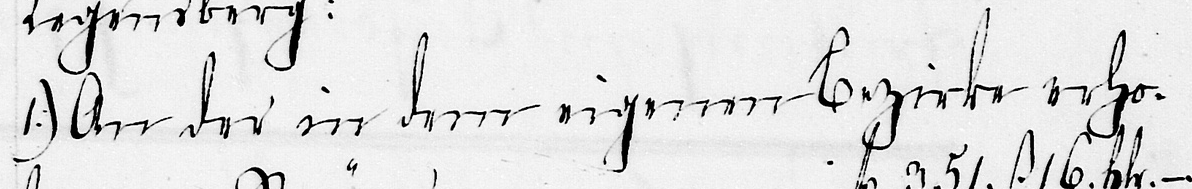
1.) An der in dem eigenen Bezirke erho¬
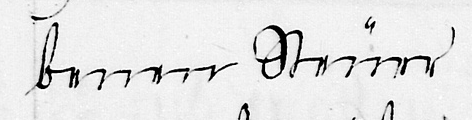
benen Steuer
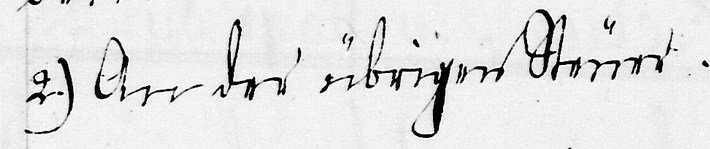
2.) An der übrigen Steuer
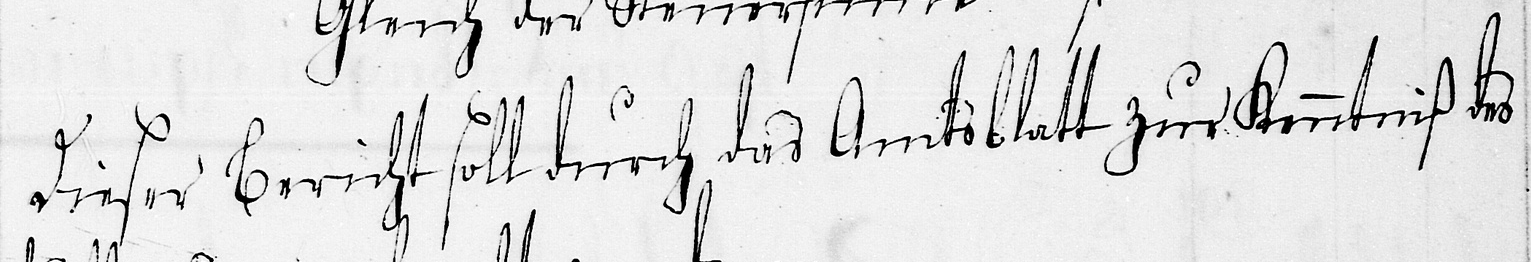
Dieser Bericht soll durch das Amtsblatt zur Kenntniß des
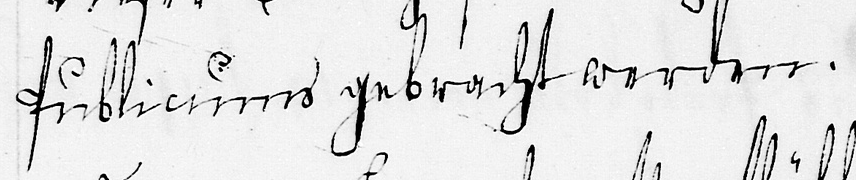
Publicums gebracht werden.
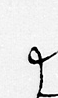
3.
